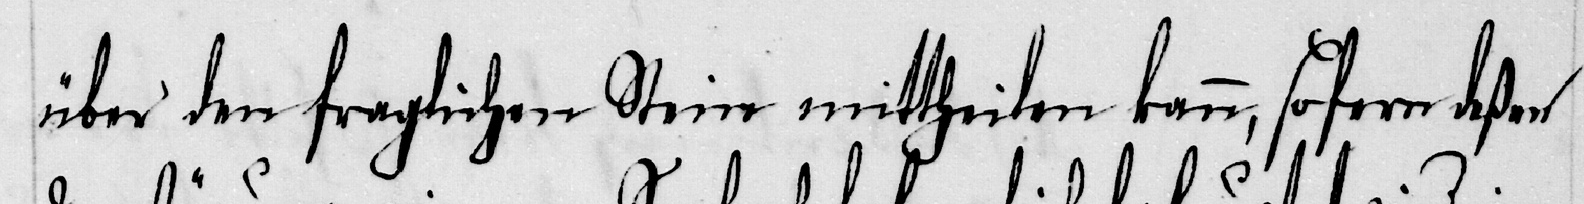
über den fraglichen Stein mittheilen kann, sofern deßen
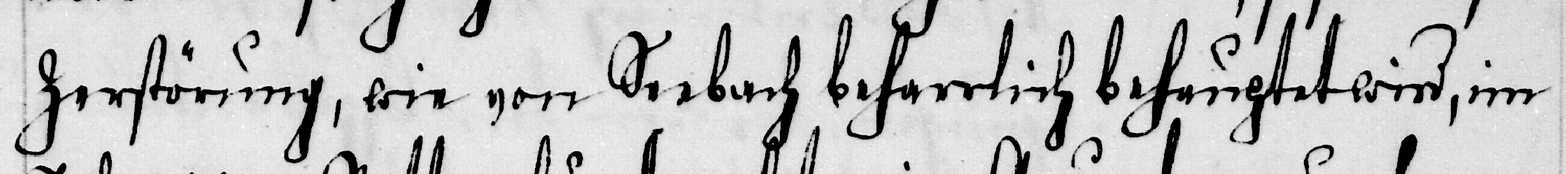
Zerstörung, wie von Seebach beharrlich behauptet wird, im
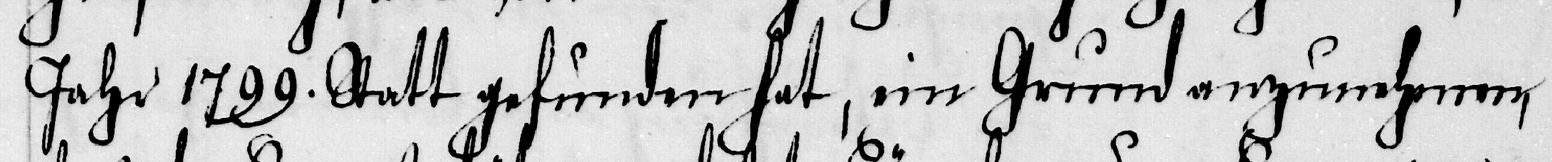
Jahr 1799. Statt gefunden hat, ein Grund anzunehmen,
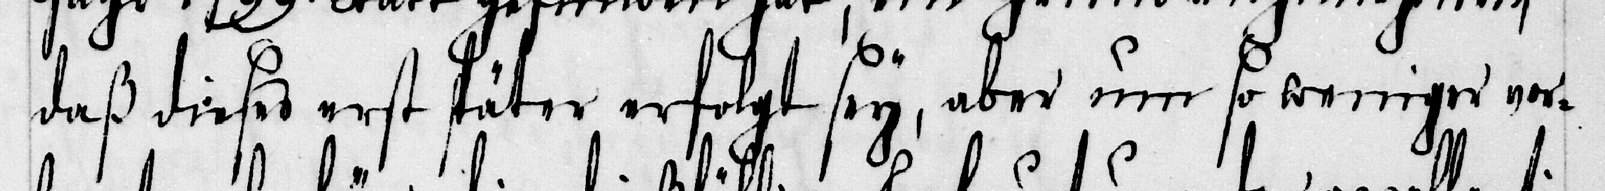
daß dieses erst später erfolgt sey, aber um so weniger vor¬
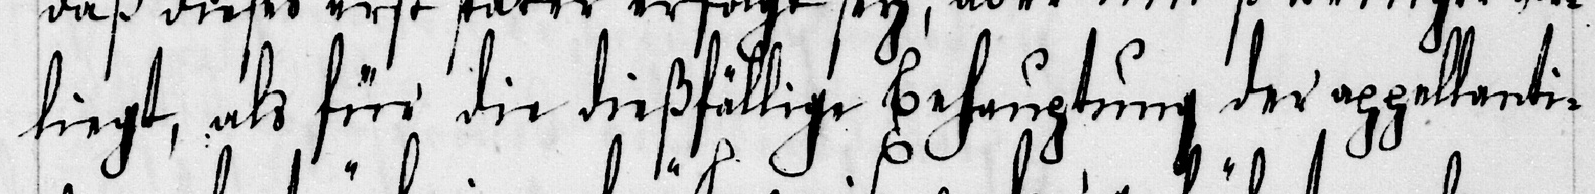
liegt, als für die dießfällige Behauptung der appel¬
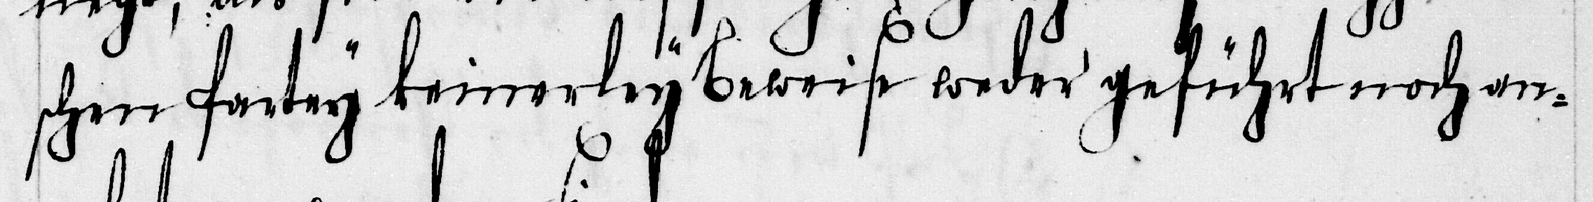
schen Partey keinerley Beweise weder geführt noch an¬
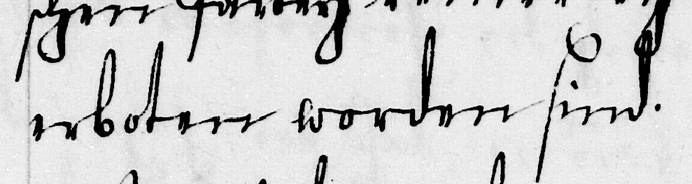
erboten worden sind.
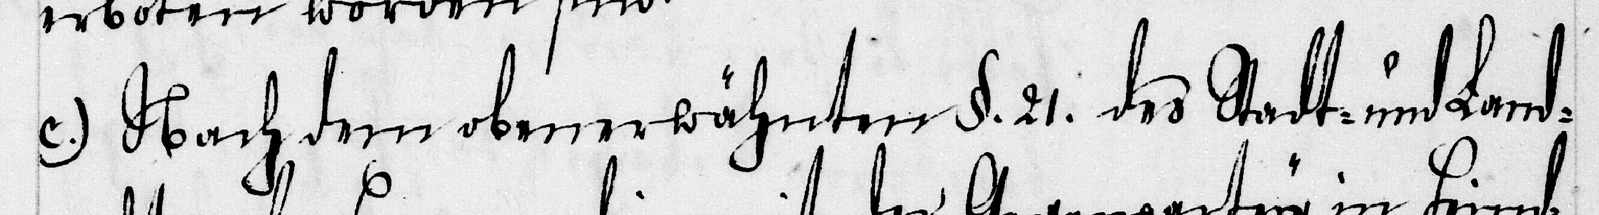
c.) Nach dem obenerwähnten §.21. des Stadt- und Land¬
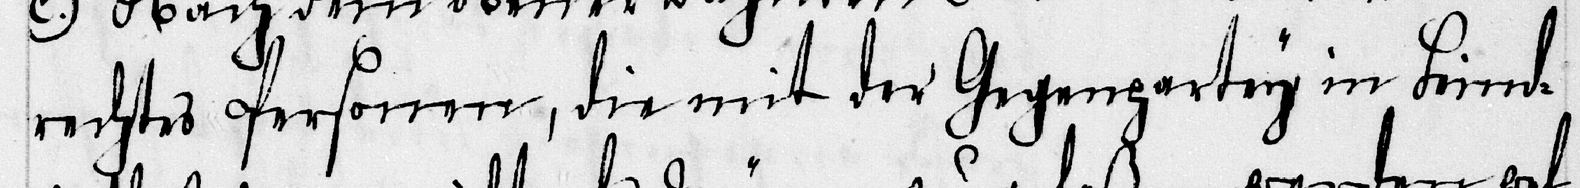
rechtes Personen, die mit der Gegenpartey in Feind¬
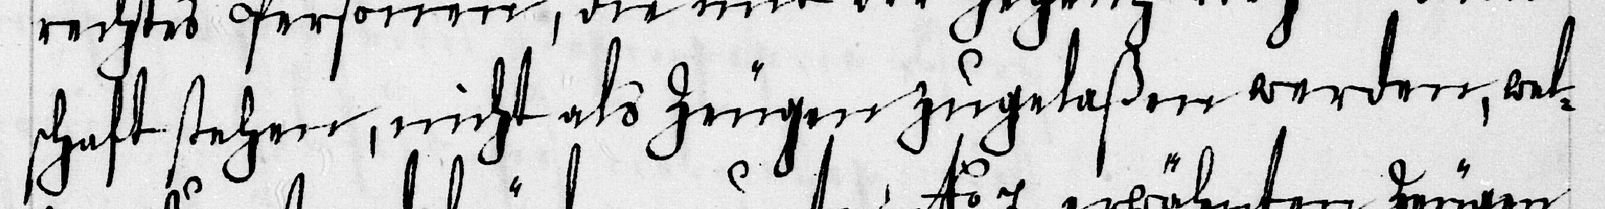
schaft stehen, nicht als Zeugen zugelaßen werden, wel¬
